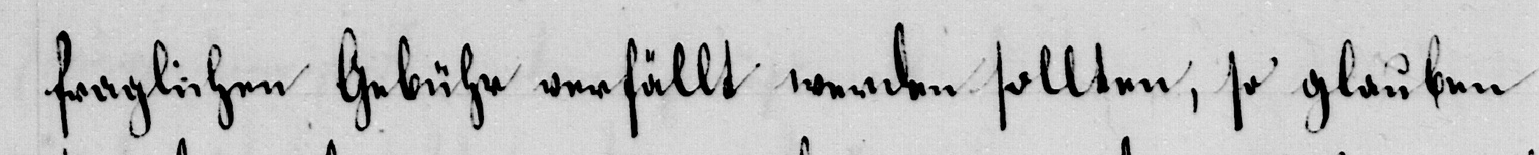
fraglichen Gebühr verfällt werden sollten, so glauben
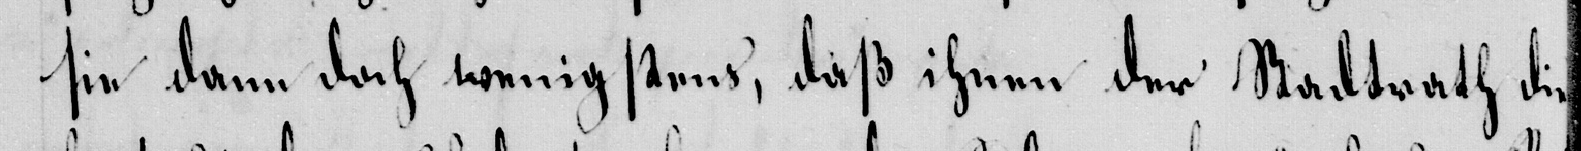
sie dann doch wenigstens, daß ihnen der Stadtrath die
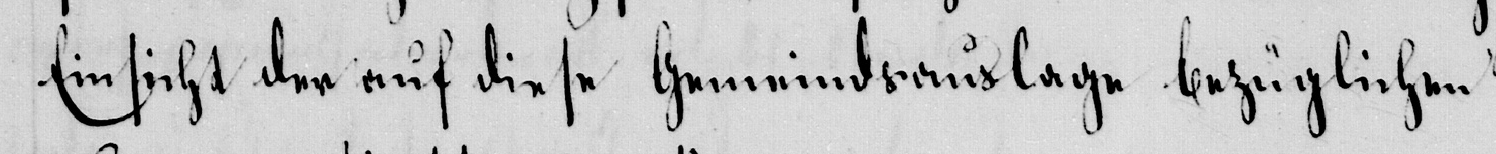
Einsicht der auf diese Gemeindsauslage bezüglichen
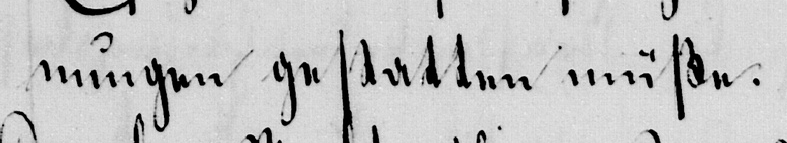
nungen gestatten müße.
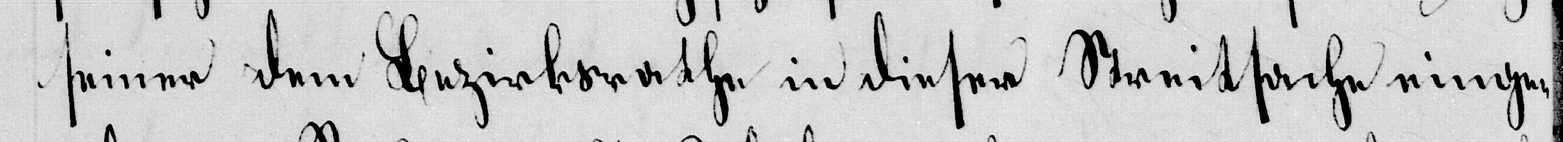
seiner dem Bezirksrathe in dieser Streitsache einge¬
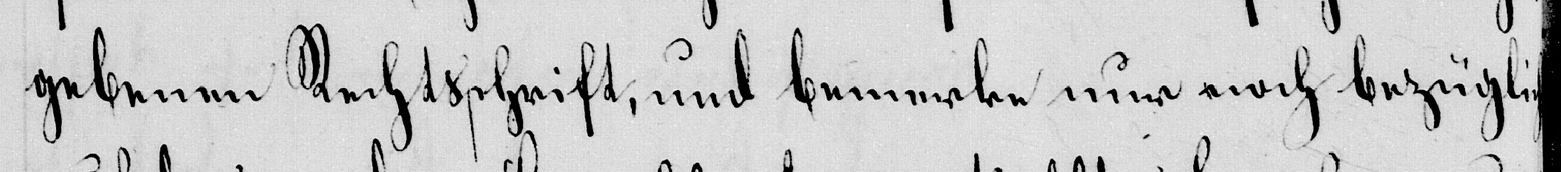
gebenen Rechtsschrift, und bemerke nur noch bezüglich
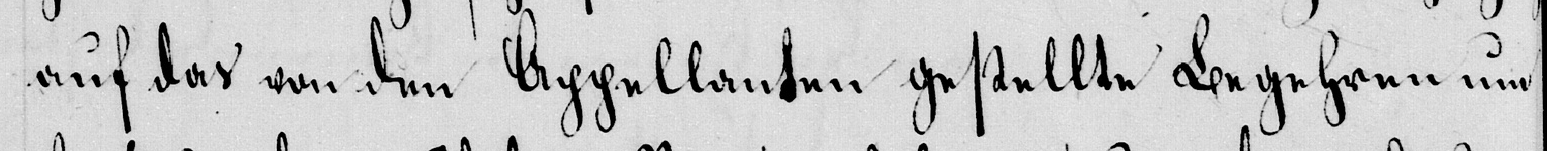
auf das von den Appellanten gestellte Begehren um
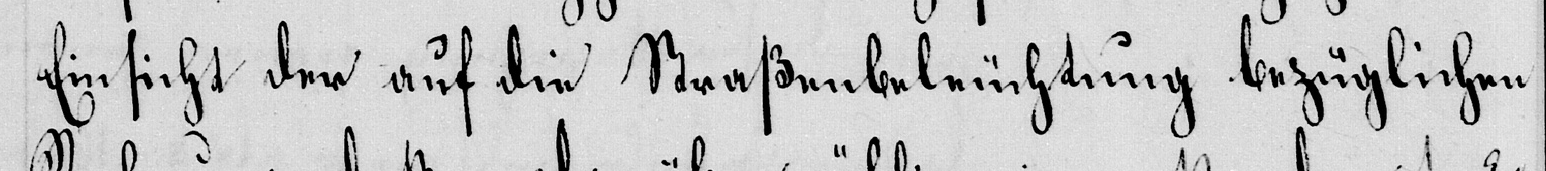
Einsicht der auf die Straßenbeleuchtung bezüglichen
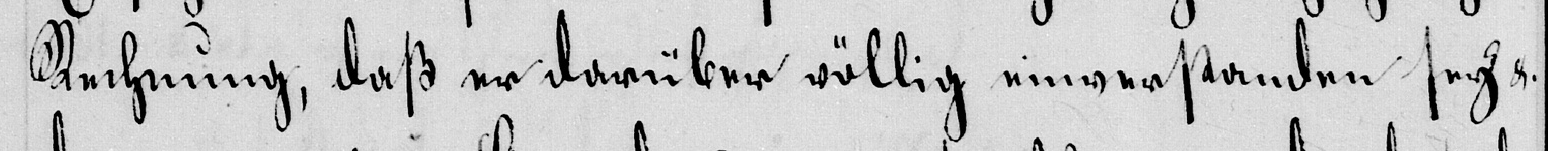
Rechnung, daß er darüber völlig einverstanden sey &.
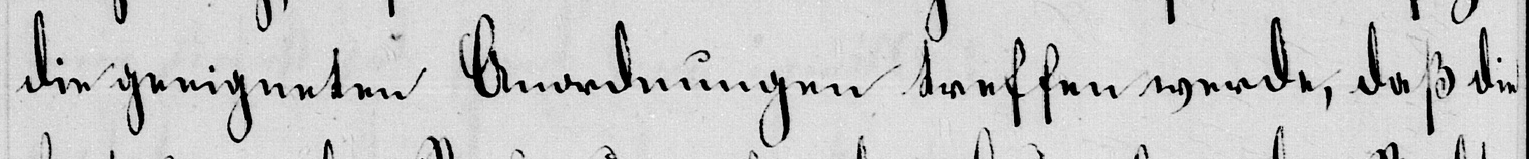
die geeigneten Anordnungen treffen werde, daß die
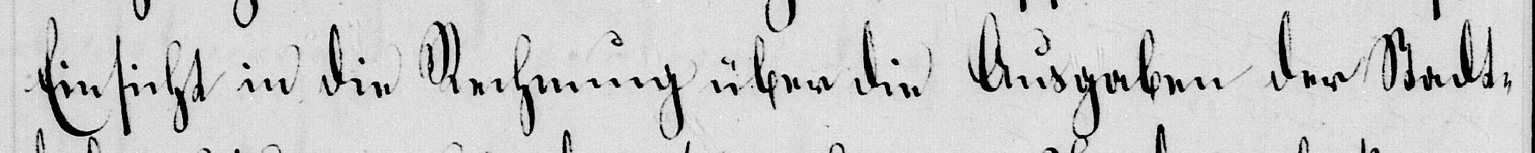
Einsicht in die Rechnung über die Ausgaben der Stadt¬
